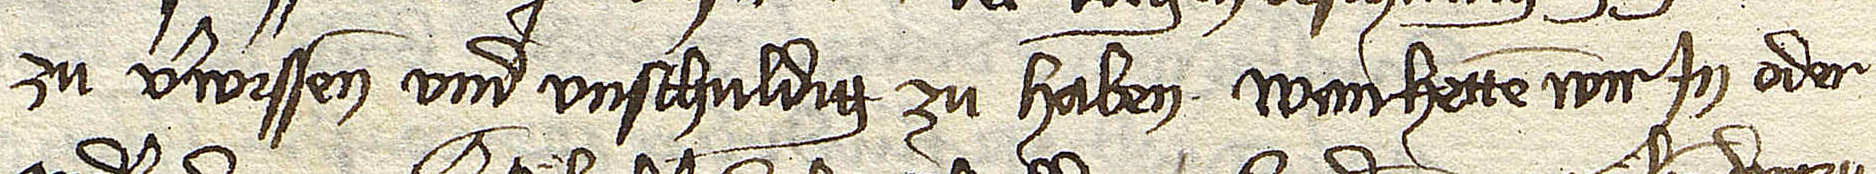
ʒu v*wiſſen vnd vnſchuldig ʒu haben . wan hette* wir In oder
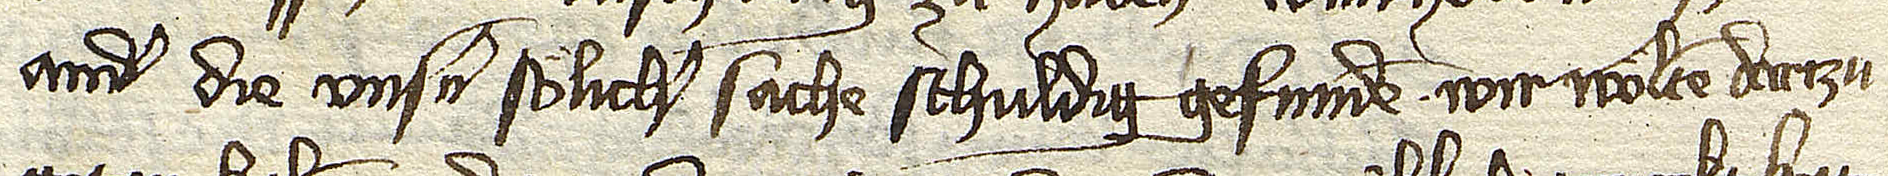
and* die vnſ*n ſölich* ſache ſchuldig gefunde* . wir wölte* darcʒu
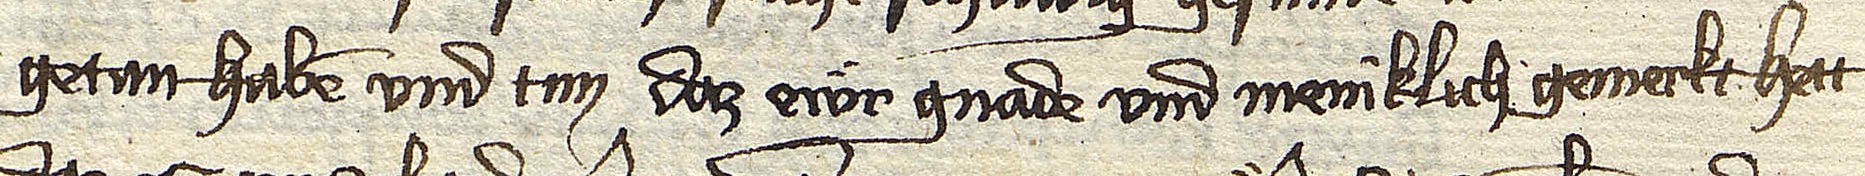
getan habe* vnd tun daʒ ewr gnade vnd meniklich gemerkt hett
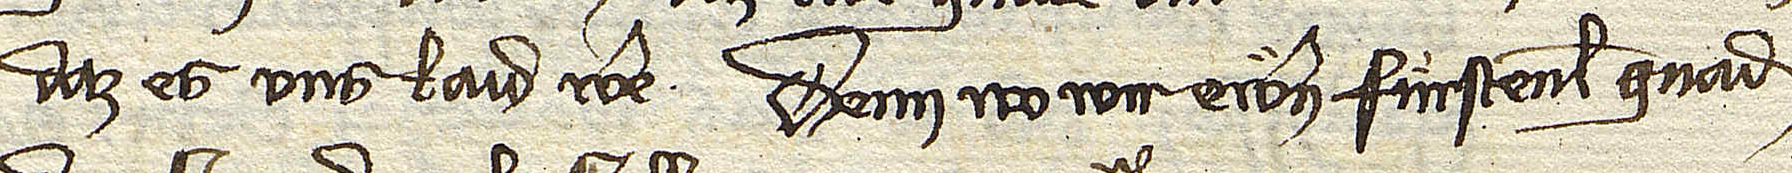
daʒ es vns laid we* . Denn wo wir ew*n fürſtenl* gnad*
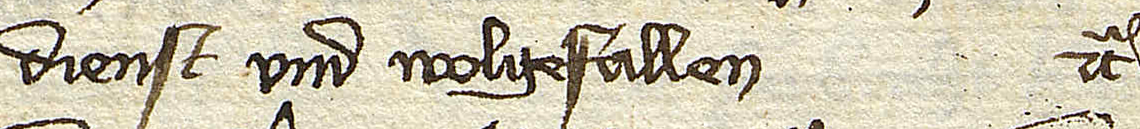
dienſt vnd wolgefallen ec*
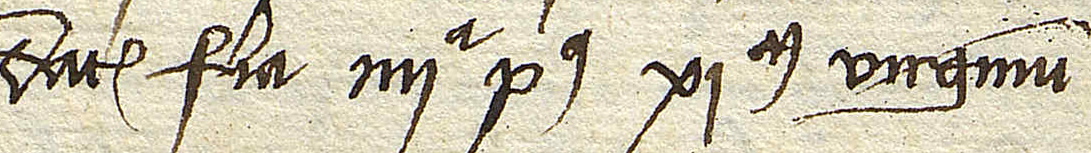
Dat* fia* iiii* p* xi* virginu*
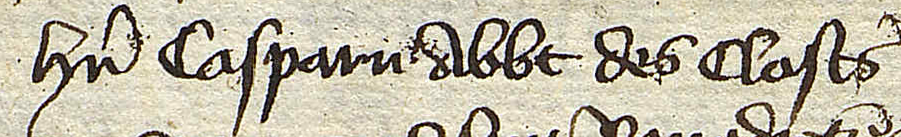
h*n Caſparn Abbt des Cloſt*s
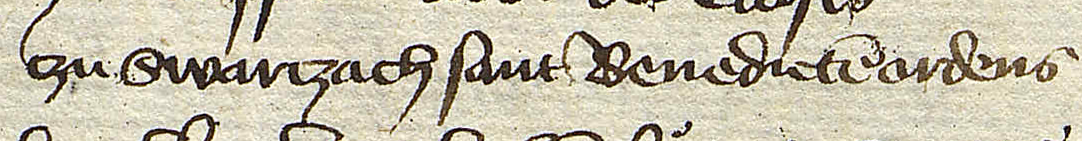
cʒu Swarcʒach ſant Benedicte* ordens
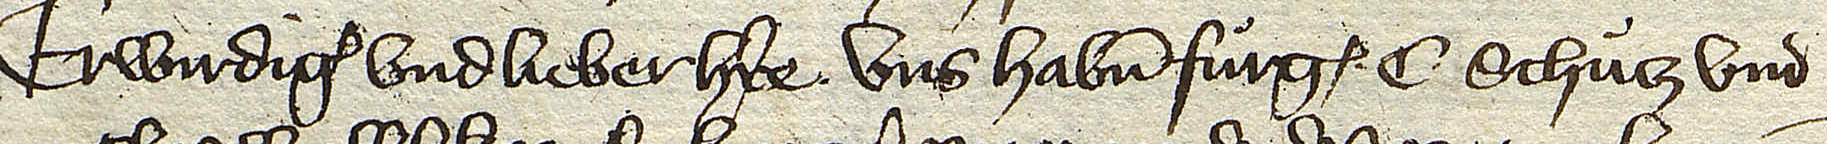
Erwirdig* vnd lieber h*re . Vns hab*n fürg* . C . Schücʒ vnd
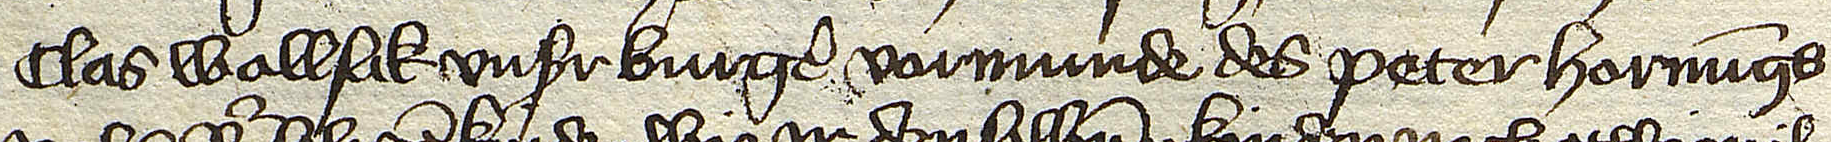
Clas wollſak vnſ*r burge* vormunde des peter hornugs*
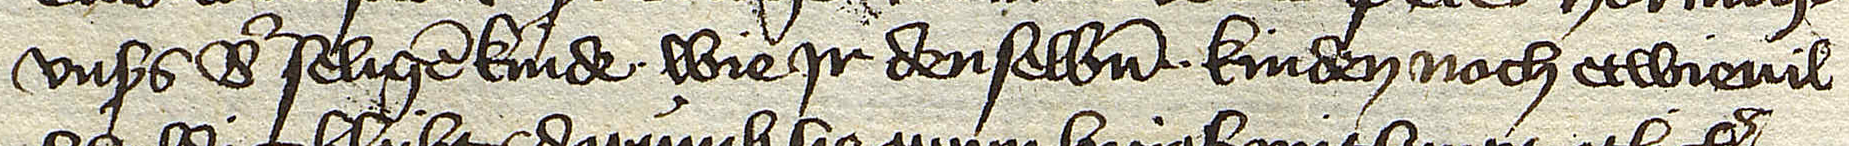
vnſ*s B* ſelige* kinde . wie Ir denſelb*n ~ kinden noch ettwieuil
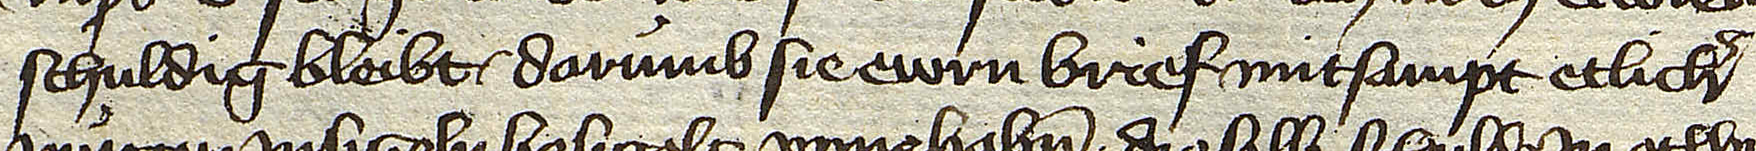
ſchuldig bleibt / darümb ſie ewrn brief mit ſampt etlich*
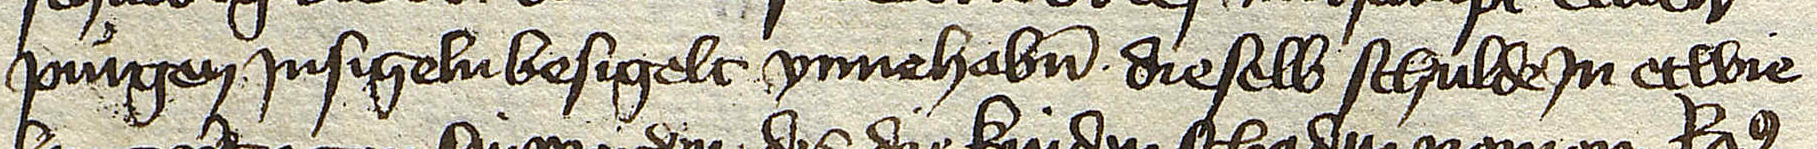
pürgen Inſigeln beſigelt ynnehab*n . dieſelb ſchulde In etwie
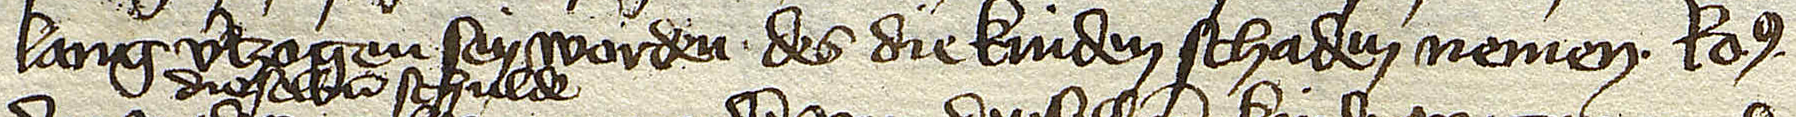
lang v*cʒogen ſey worden . des die kinden ſchaden nemen . Ro*
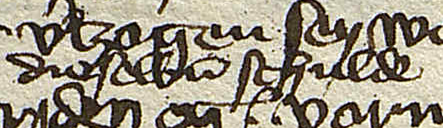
dieſelb*n ſchulde
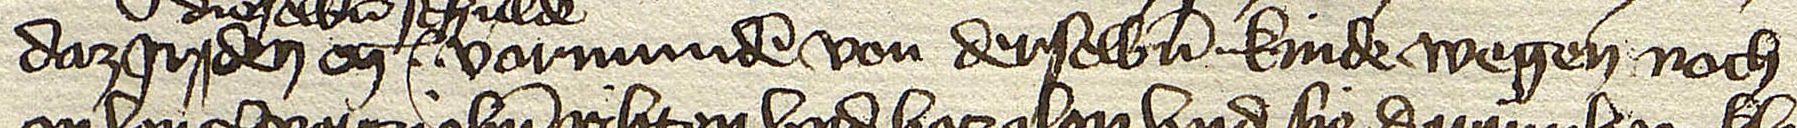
daʒ Ir den eg* vormunde* von derſelb*n ~ kinde wegen noch
